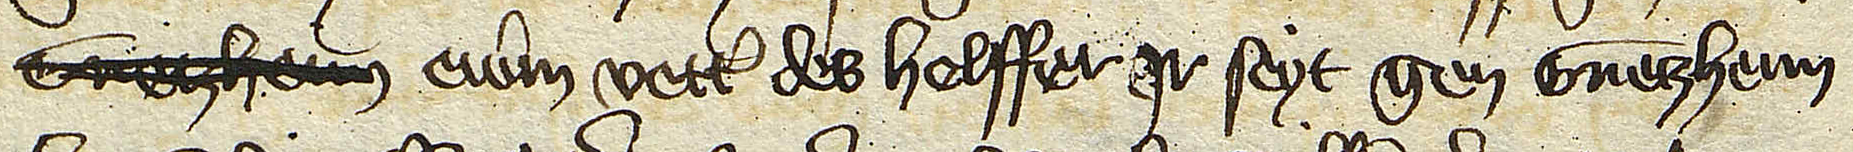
Gnecʒheim ew*m vett* des helffer Ir ſeyt gen Gnecʒheim
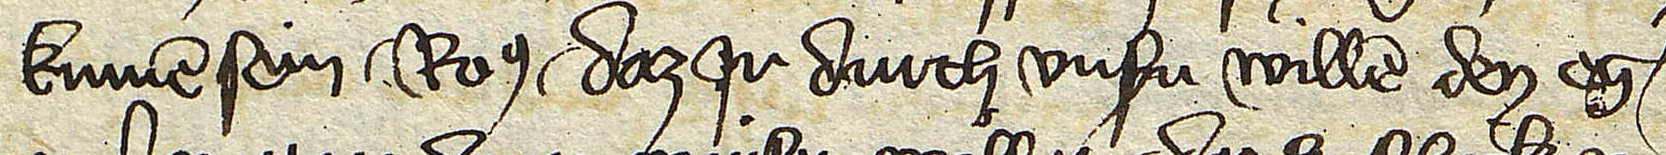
kume* ſein / Ro* / daʒ Ir durch vnſ*n wille* den eg*
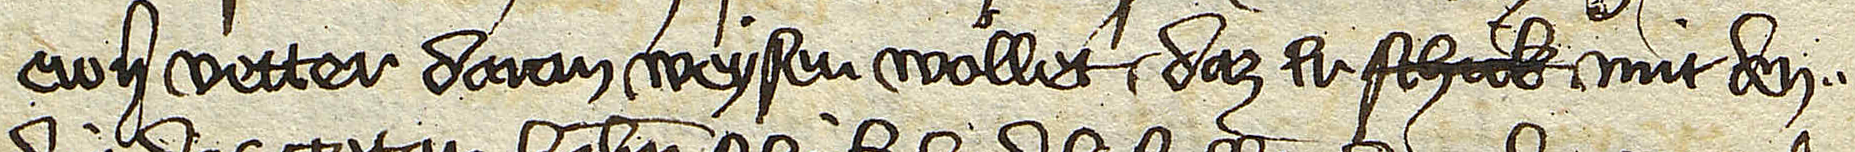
ewn* vetter daran weyſen wöllet / daʒ Er ſchick mit den ~
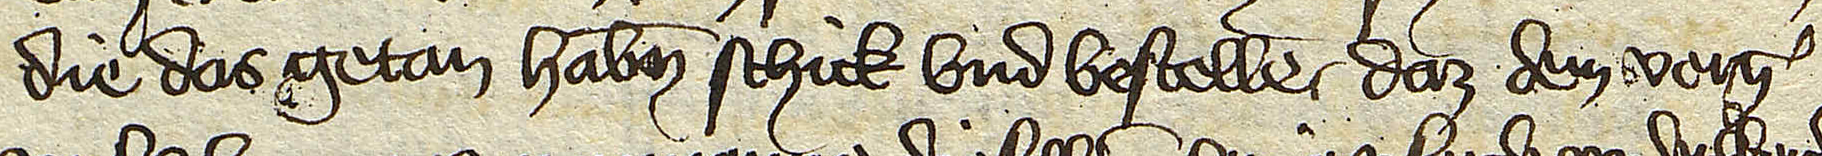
die das getan habn* ſchick vnd beſtelle / daʒ den vorg*
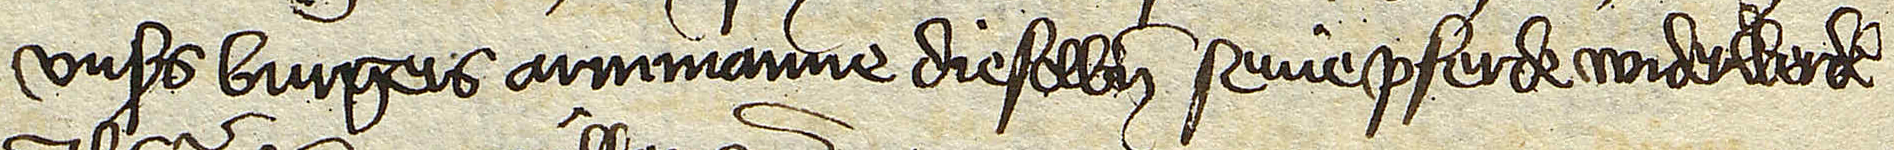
vnſ*s burgers armmanne dieſelbn* ſeine pferde widerwerde*
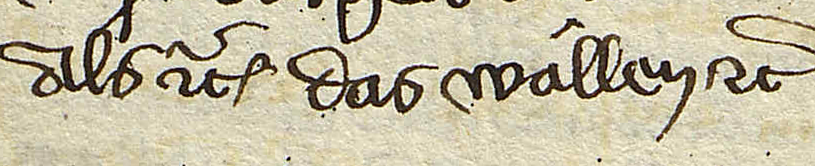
Als ec* das wöllen ec*
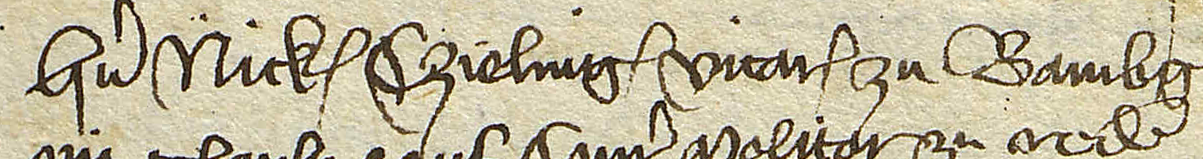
hn* Nick* Cʒieling* vicar* cʒu Bambg*
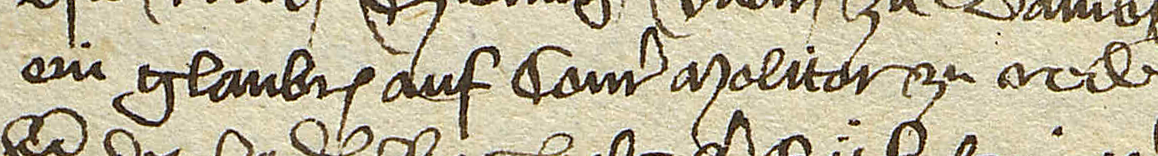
ein glaubr* auf Conr* Molitor cʒu red*
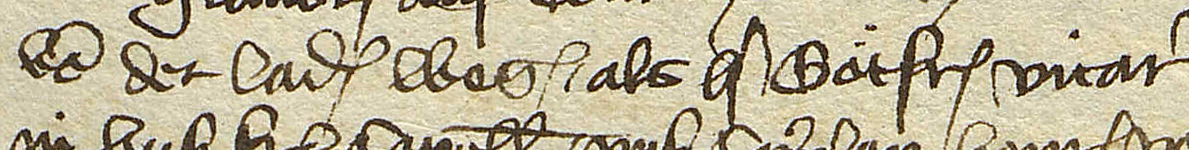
vo* der lad* weg* / als h* Götfr* vicar*
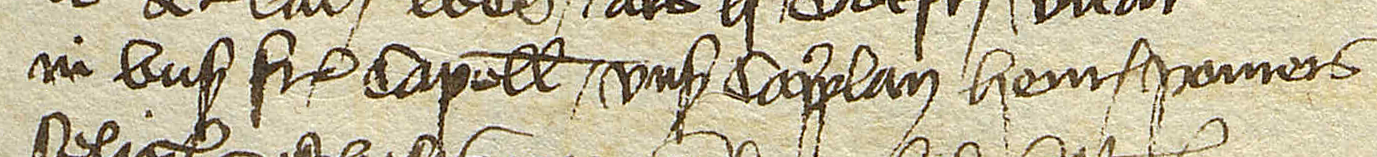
in vnſ* fr* Capell / vnſ* Capplan hein* p%%ers
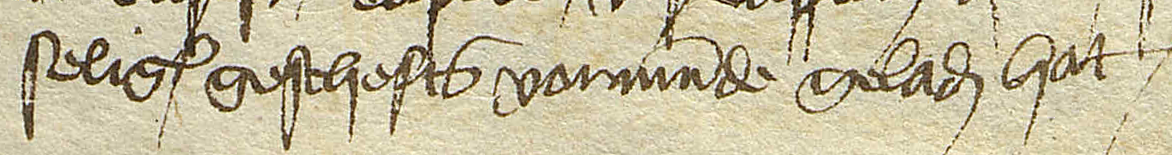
ſelig* geſchefts vormu*de gelad* hat
